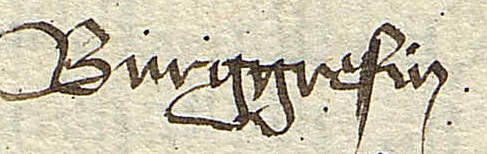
Burggrefin
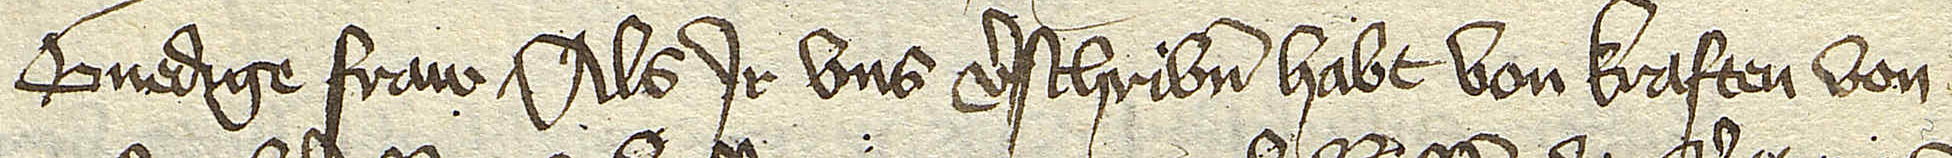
Gnedige fraw / Als Ir vns v*ſchribn* habt von Kraften von
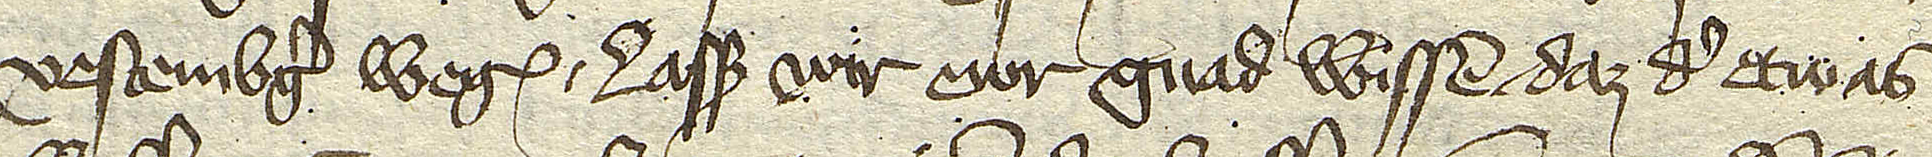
veſtembg* weg* / Laſſ* wir ewr gnad wiſſe* / daʒ d* etwas
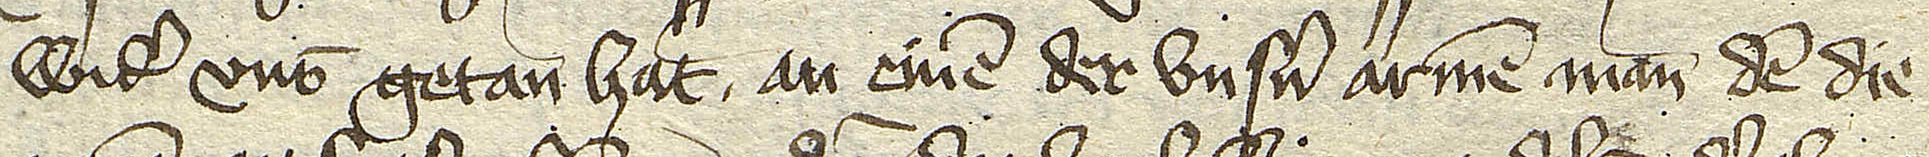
wid* vns getan hat / an eine* der vnſn* arme* man de* die
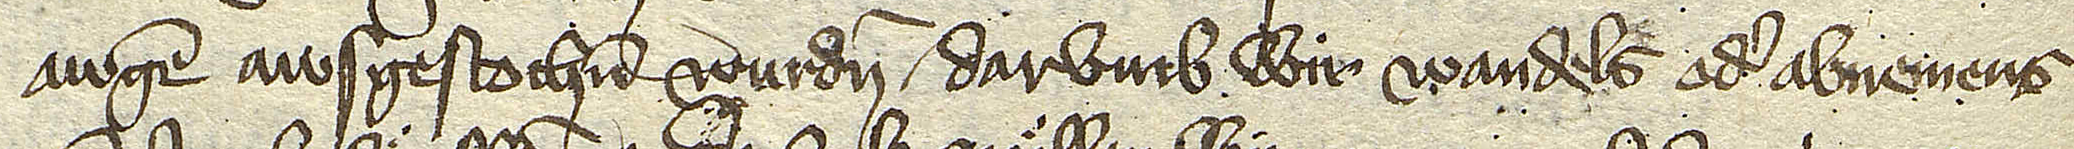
awge* awſgeſtochn* wurdn* / darvmb wir wandels od* abnemens
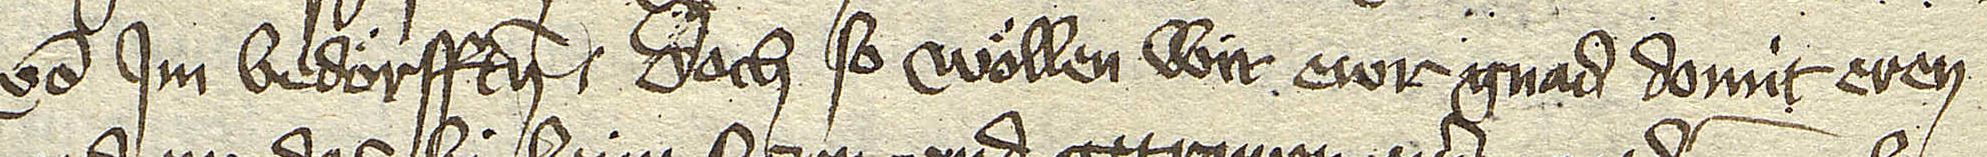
vo* Im bedörfftn* / Doch ſo wöllen wir ewr gnad domit eren
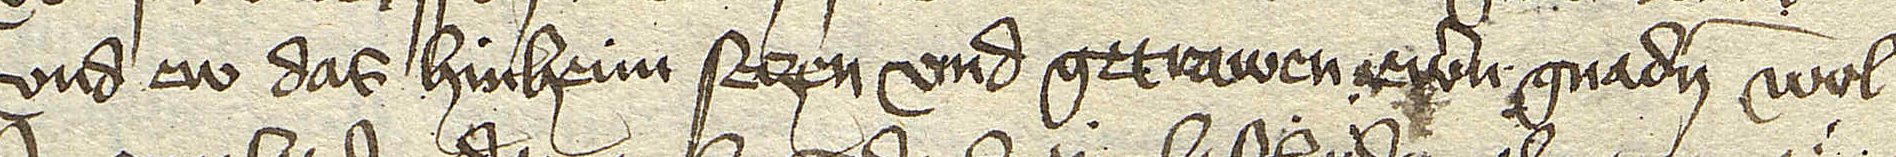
vnd ew das hinheim ſecʒen vnd getrawen ew*n gnadn* wol
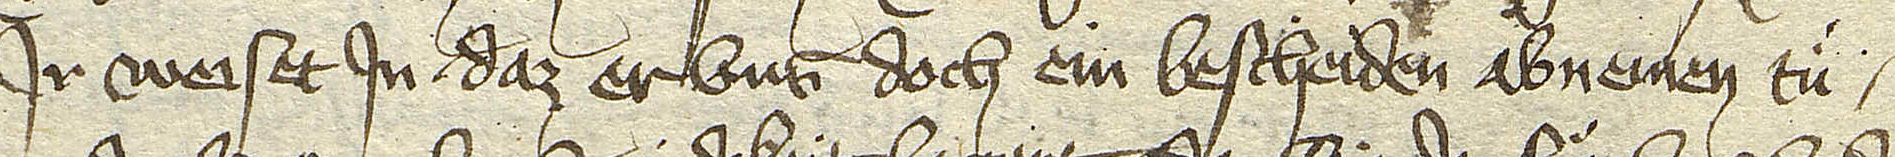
Ir weiſet In / daʒ er vnd doch ein beſcheiden abnemen tü /
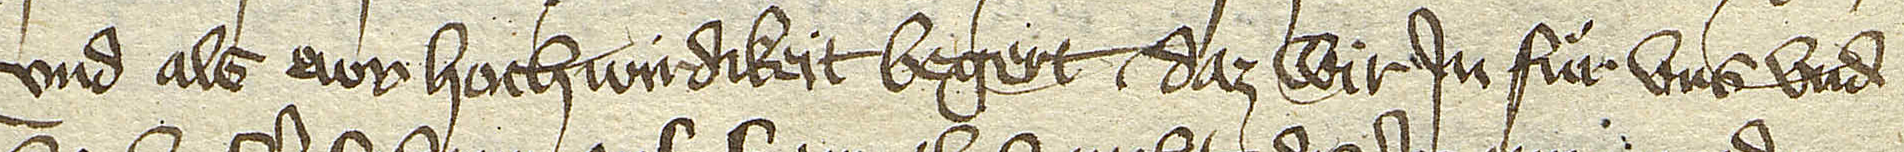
vnd als ewr hochwirdikeit begert / daʒ wir In für vns vnd
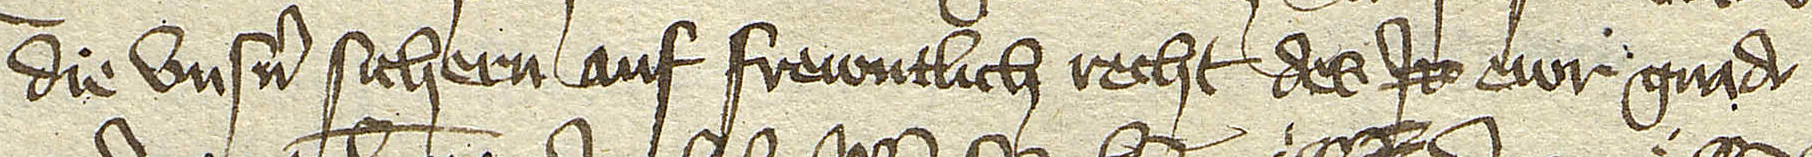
die vnſn* ſichern auf frewntlich recht des Ir ewr gnad
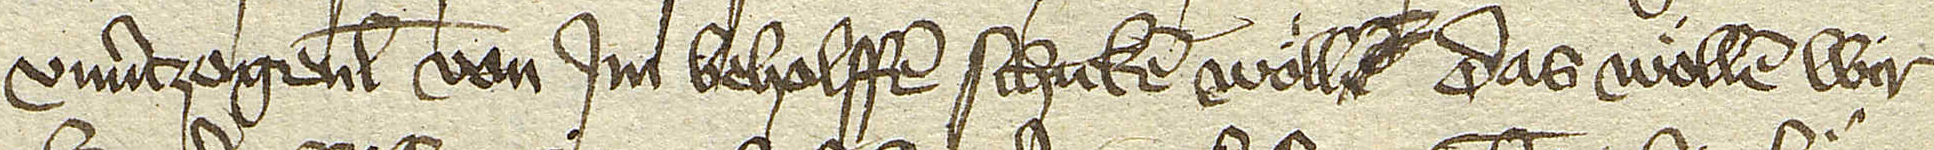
vnu*cʒogenl* von Im beholffe* ſchicke* wölle* Das wölle* wir
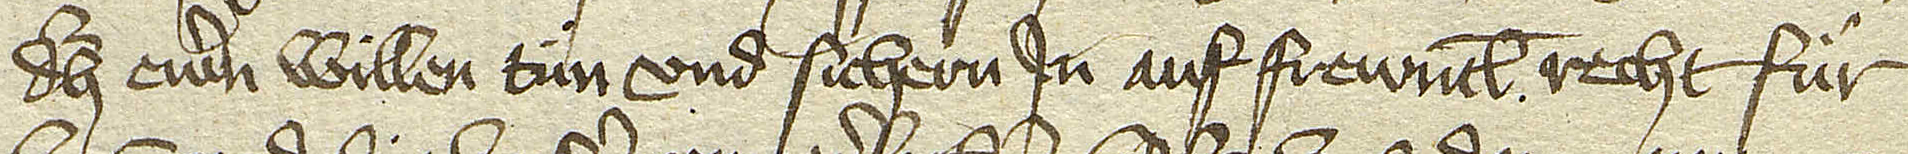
d*h ew*n willen tün vnd ſichern In aud frewntl* recht für
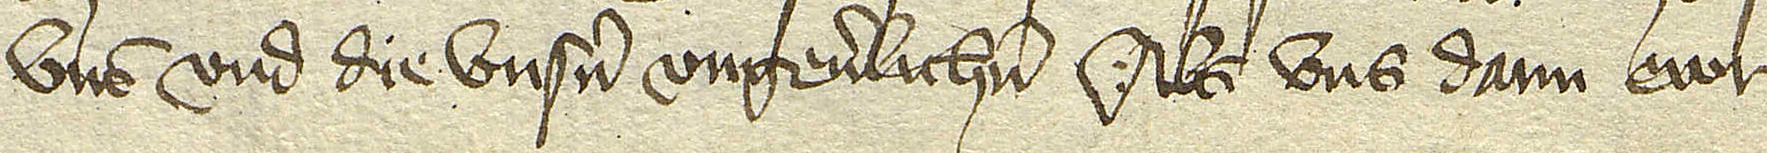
vns vnd die vnſn* vngeu*lichn* Als vns dann ewr
